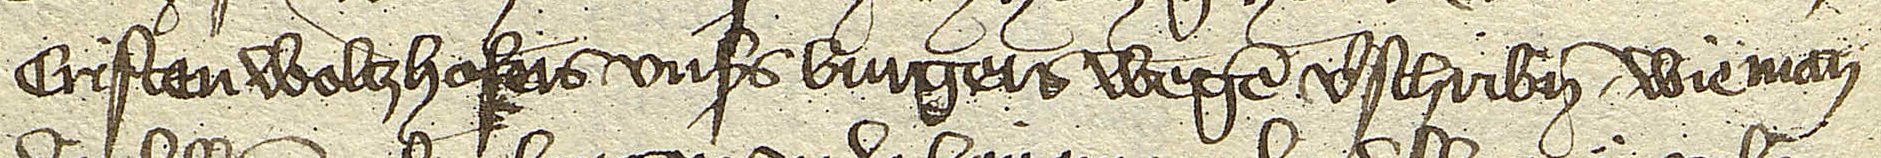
Criſten Wolcʒhofers vnſ*s burgers wege* v*ſchribn* / wie man
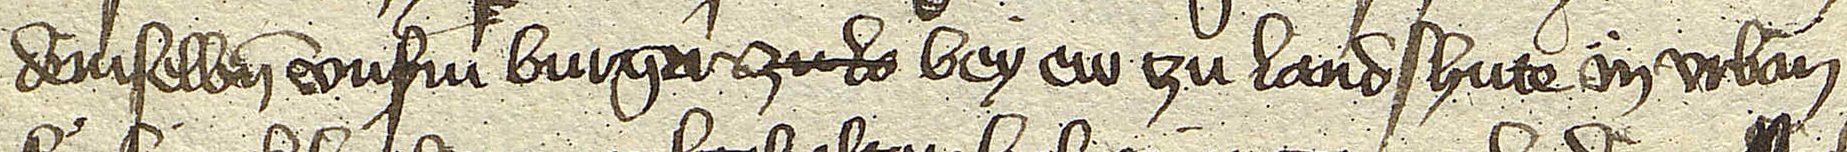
demſelbn* vnſ*m burger cʒu la bey ew cʒu landſhute in vrban
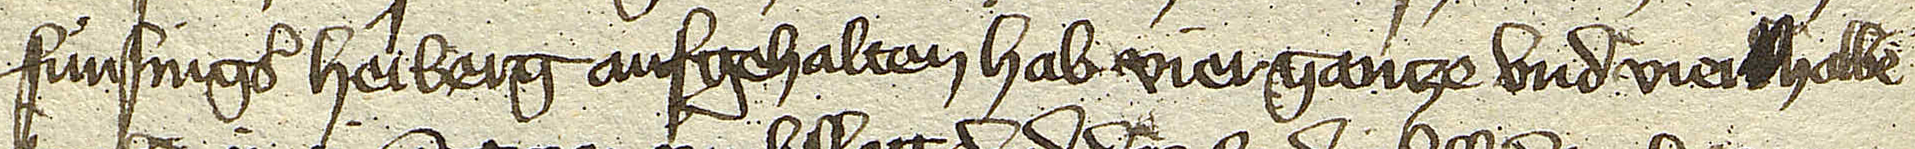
fünfings* herberg aufgehalten hab vier gancʒe vnd vier halbe
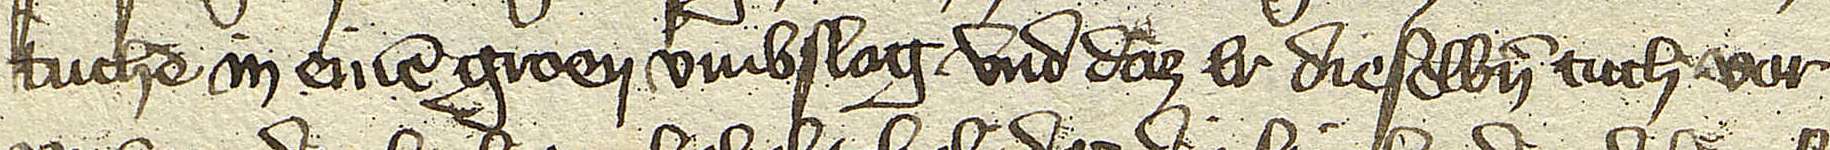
tuche in eine* groen vmbſlag / vnd daʒ er dieſelbn* tuch vor
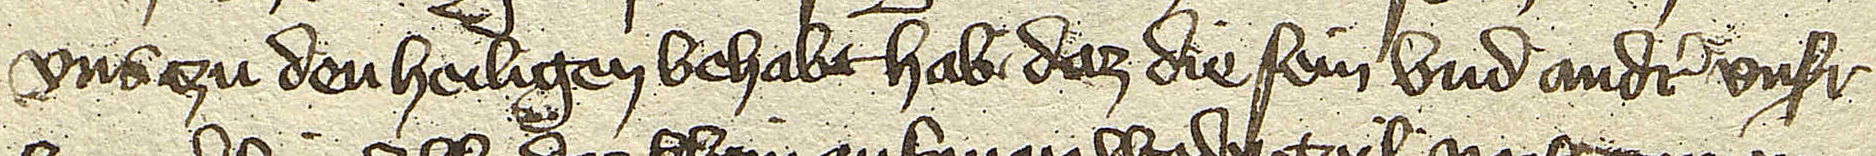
vns cʒu den heiligen behabt hab / daʒ die ſein vnd andr* vnſ*r
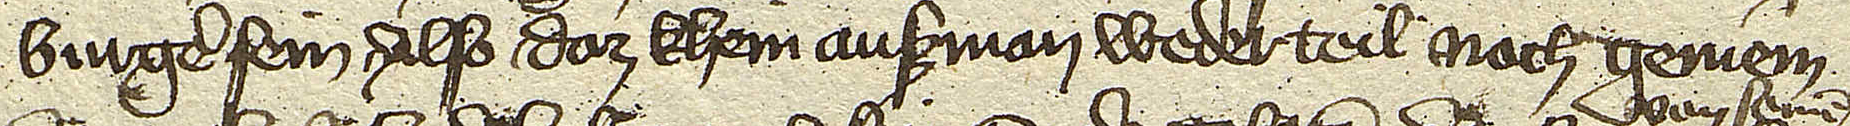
burge* ſein / Alſo / daʒ khein auſʒman weder teil noch gemein
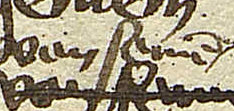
von ſeine*
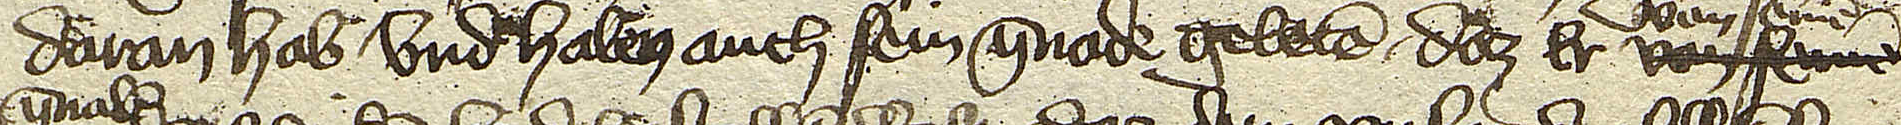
daran hab / vnd haben auch ſein gnade gebete* / daʒ Er von ſeine*
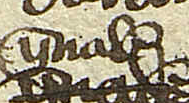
gnad*
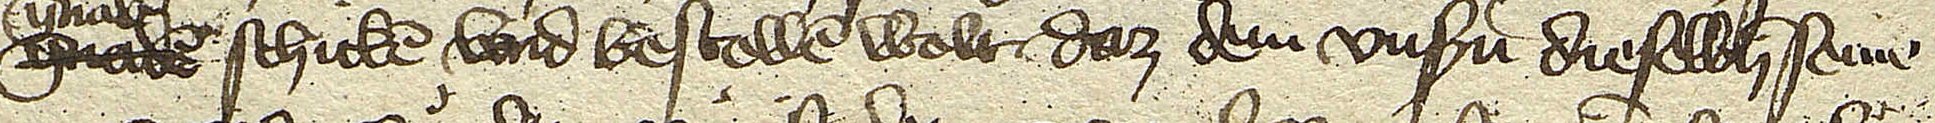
gnade* ſchicke* vnd beſtelle* wolt / daʒ dem vnſ*n dieſelbn* ſeine
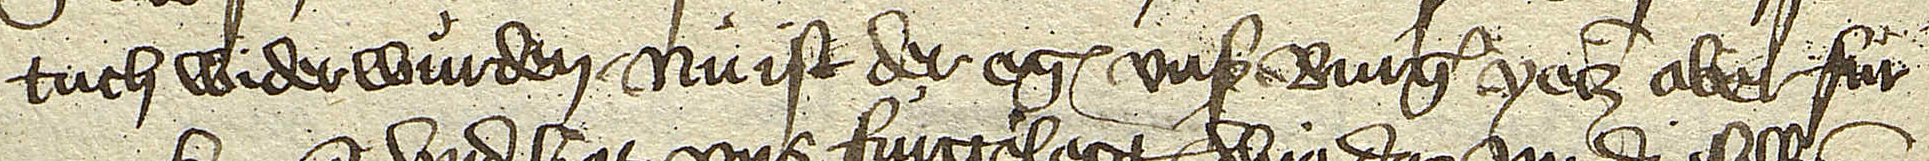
tuch wider würden / Nü iſt der eg* vnſ* Burg* yecʒ* aber für
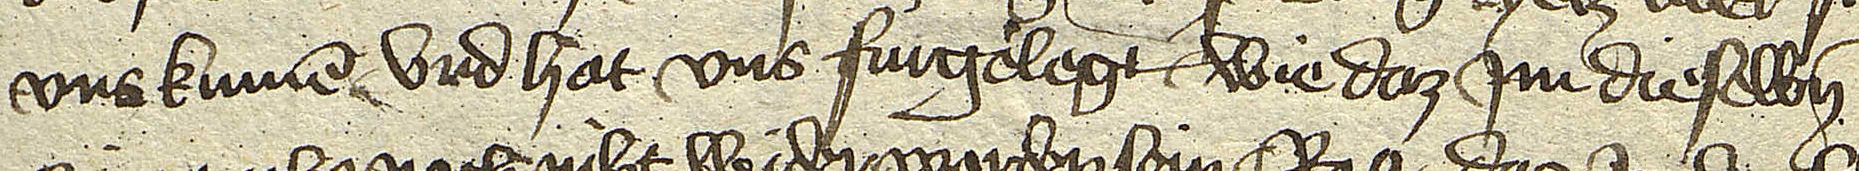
vns kume* vnd hat vns fürgelegt / wie daʒ Im dieſelbn*
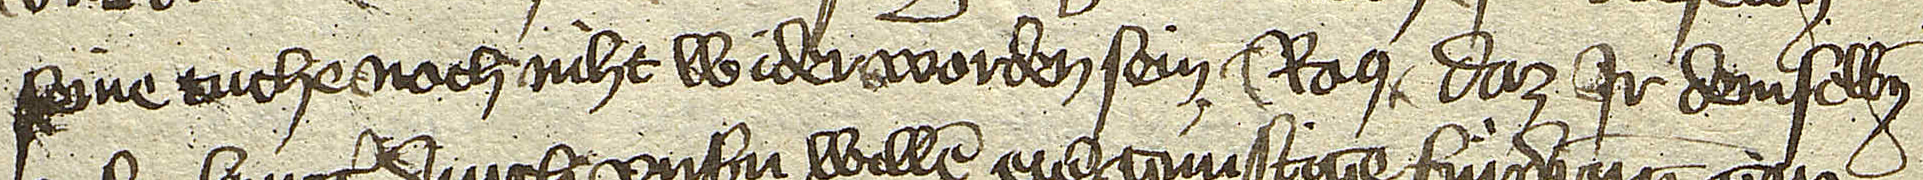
ſeine tuche noch niht wider worden ſein / Ro* / daʒ Ir demſelbn*
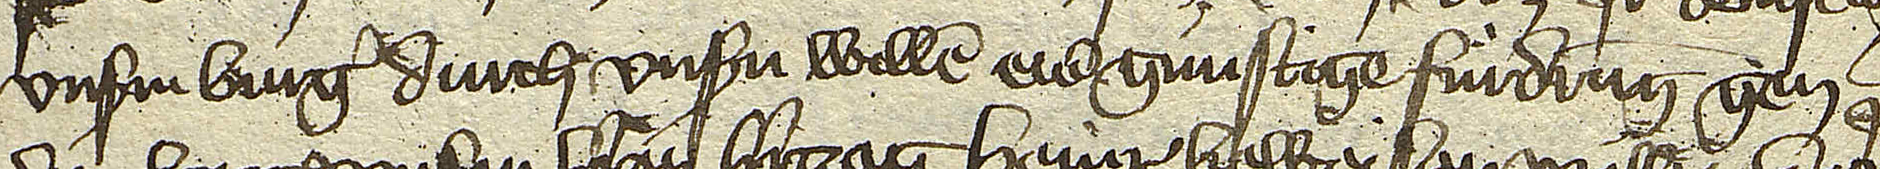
vnſ*m burg* durch vnſ*n wille ew* günſtige fürdrug* gen
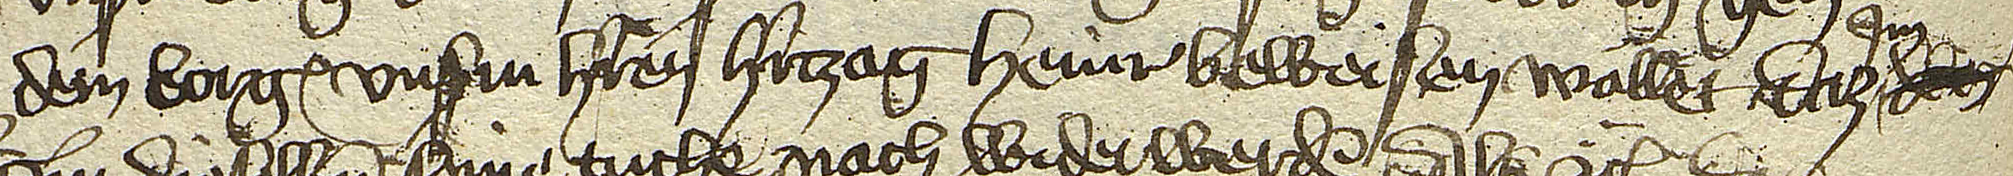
dem vorg* vnſ*m h*ren h*rcʒog heinr* beweiſen wöllet / daʒ dem
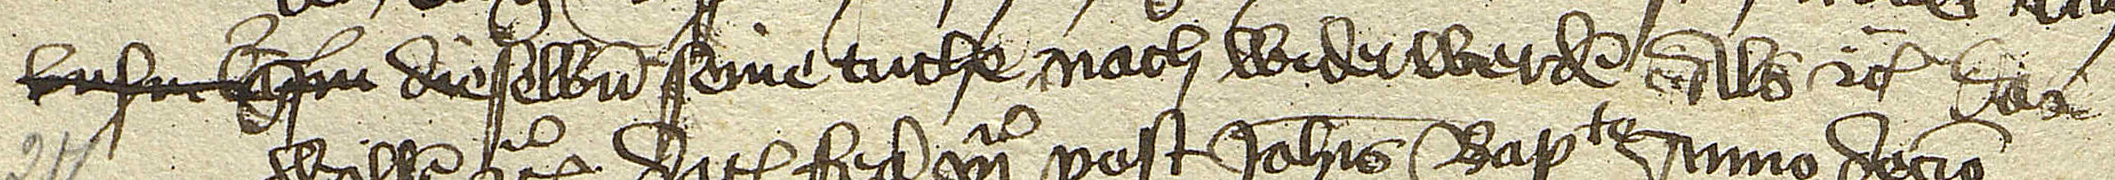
vnſ*m b*g*Im dieſelbn* ſeine tuche / noch widerwerd* / Als ec* das
